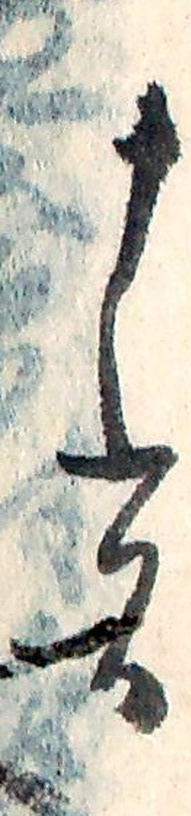十六日
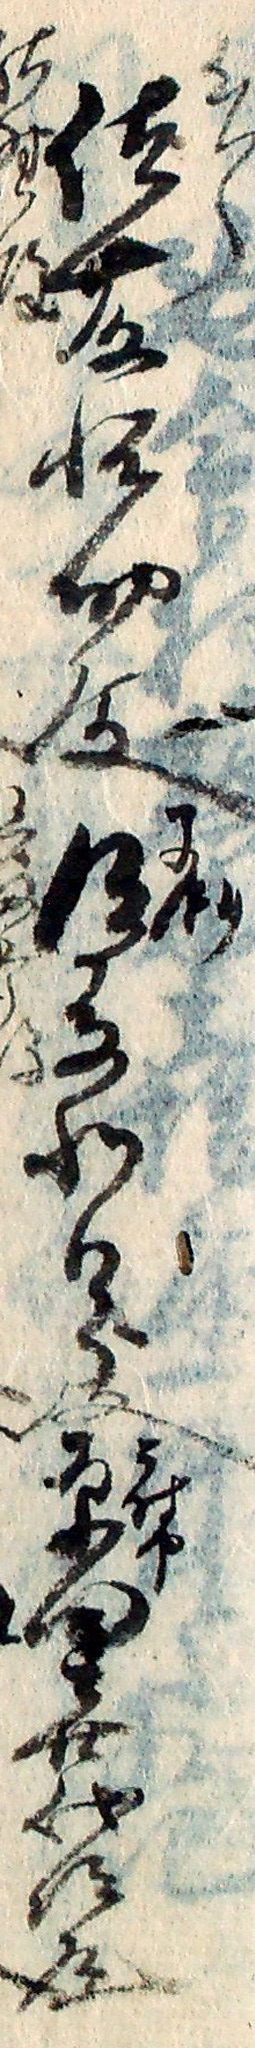佐藤悦助殿後藤利八郎殿原田喜代次殿
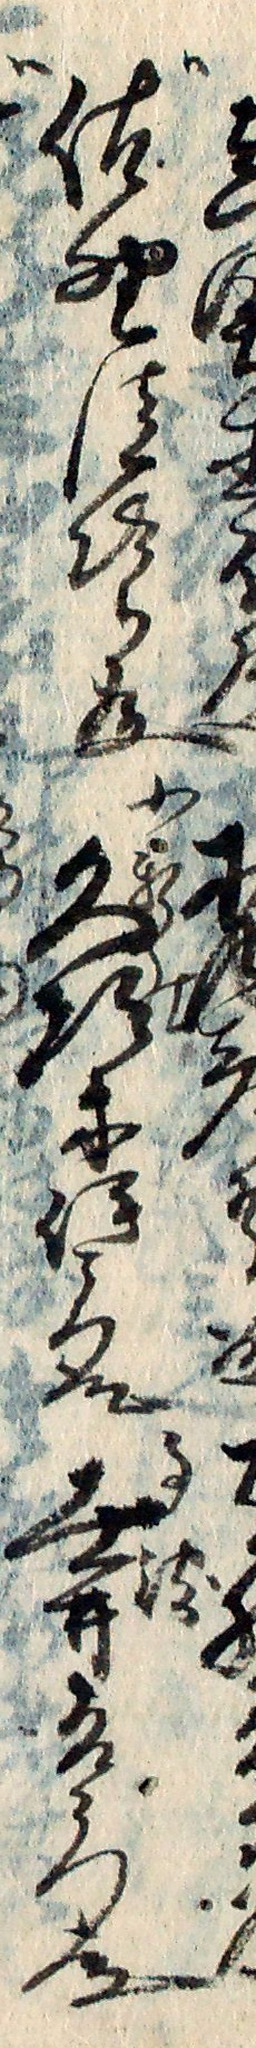佐野清次郎殿久須米伊右衛門殿在井吉右衛門殿
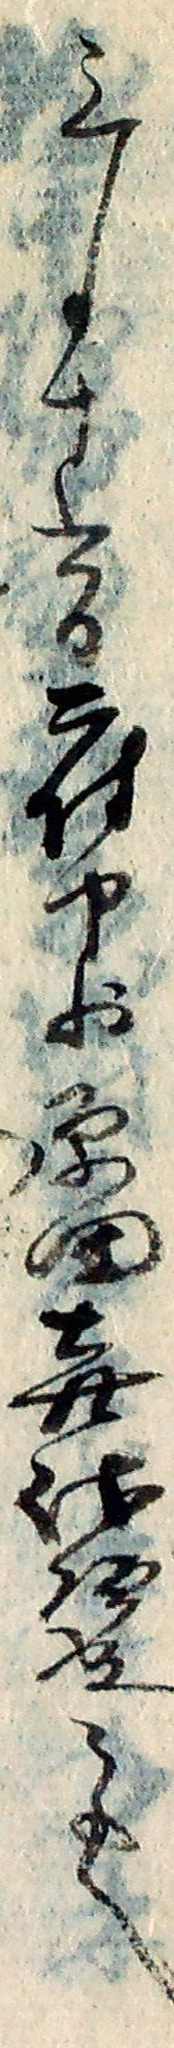三月十六日府中村原田喜代次殿方へ

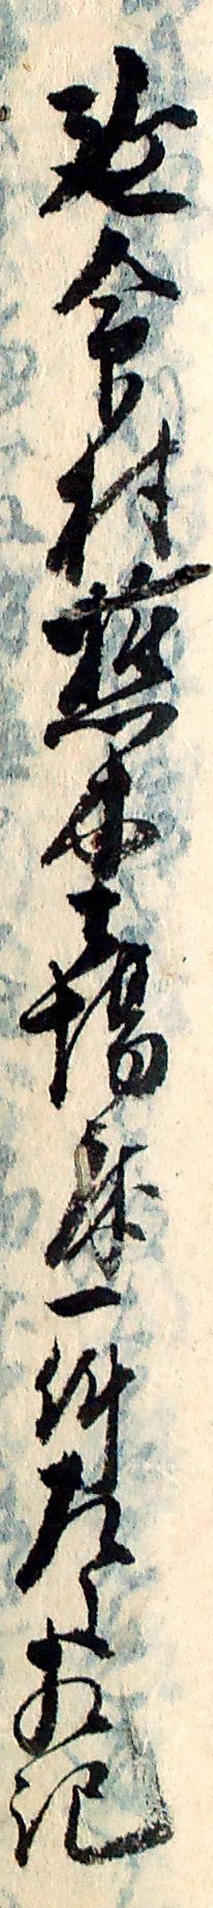延命村樵木土場床一件左に相記
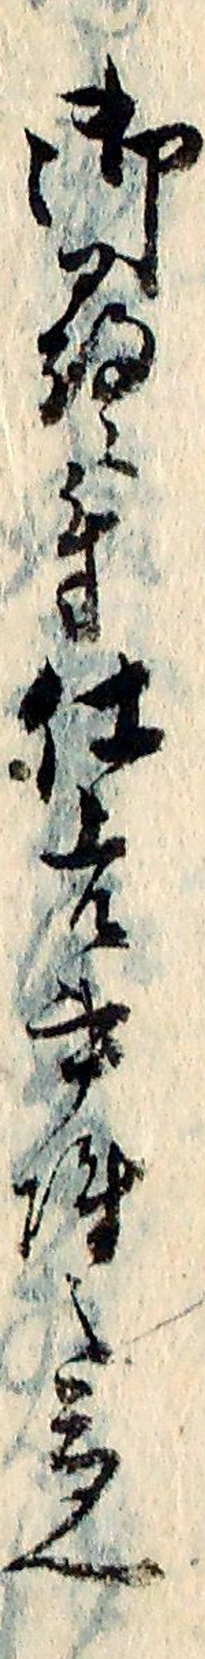御尋に付仕上る書付之覚
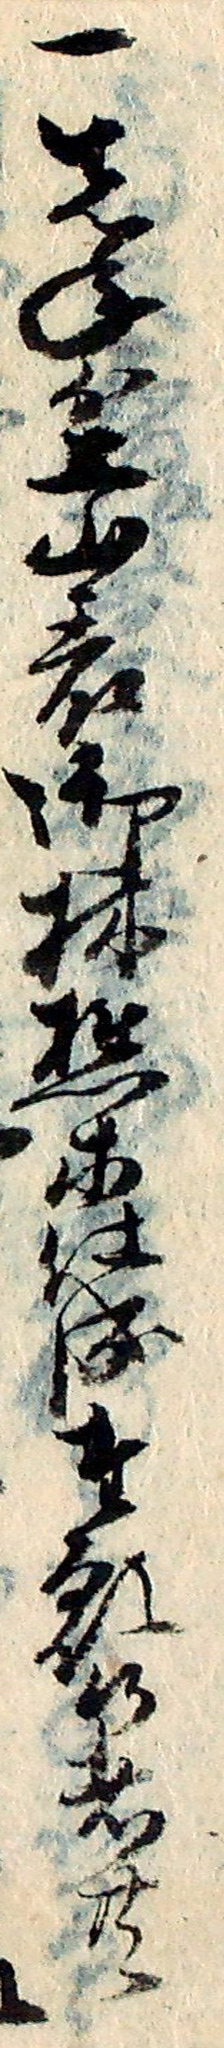一先年ゟ上山表御林樵木仕成奉願候者共
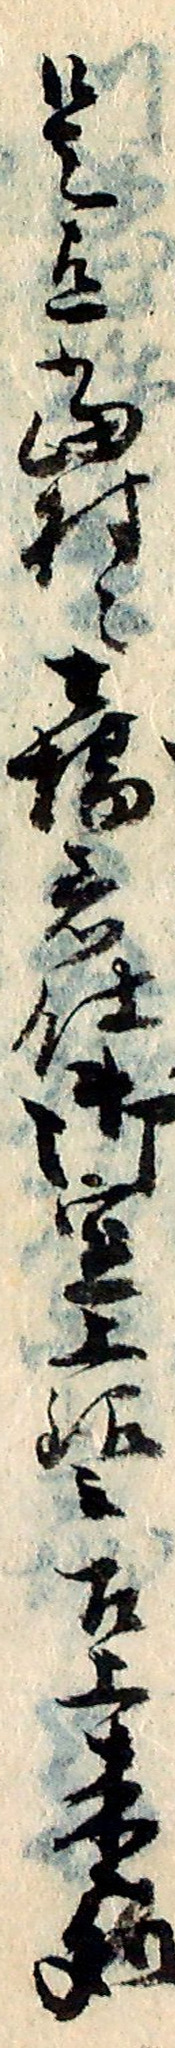是迄当村に土場着仕御運上銀被召上来候処
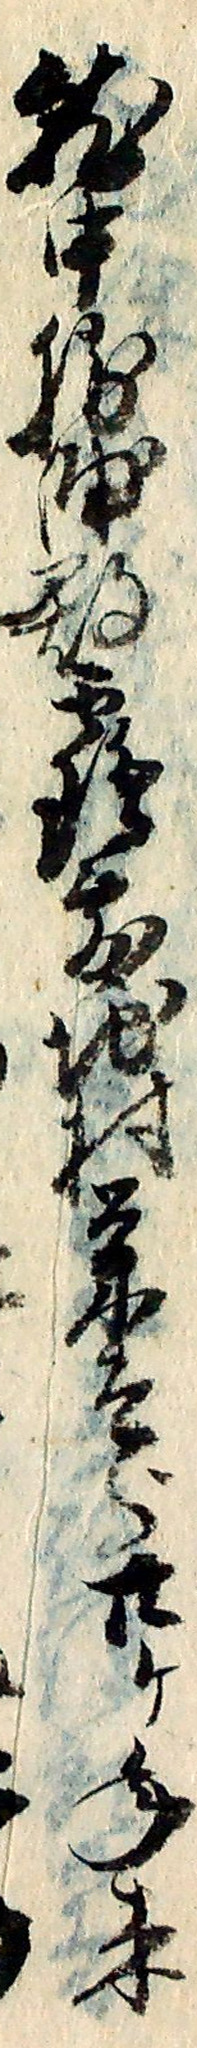就中勝浦郡鶴敷地村栄太郎廿ヶ年来
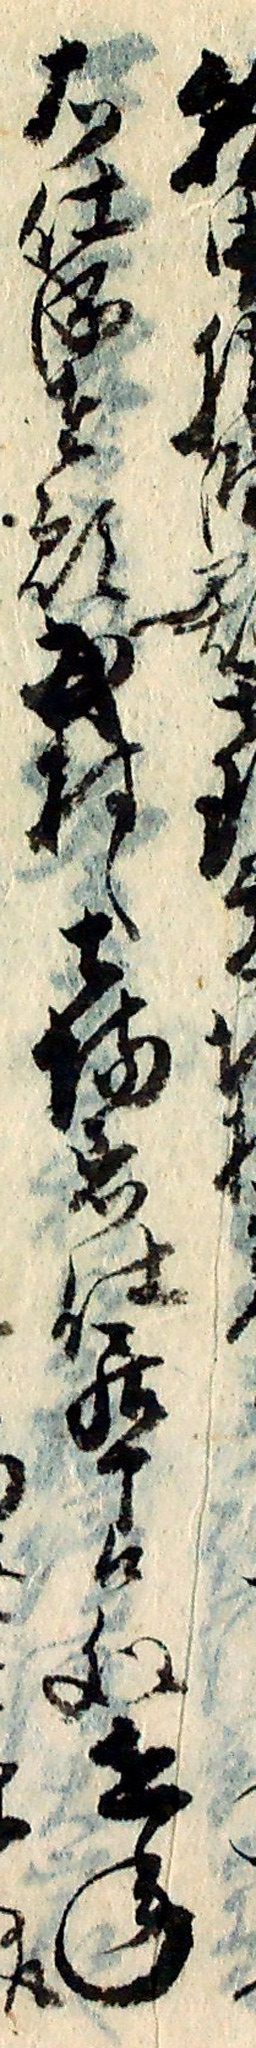右仕成奉願当村へ土場着仕居申候処近年
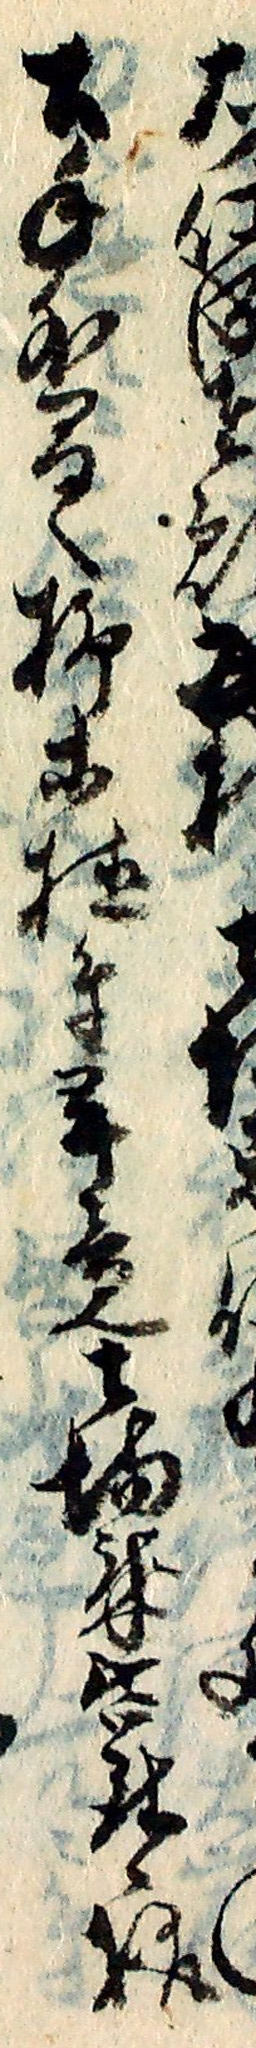土手外間へ柳木植付畢竟土場床無御座候様
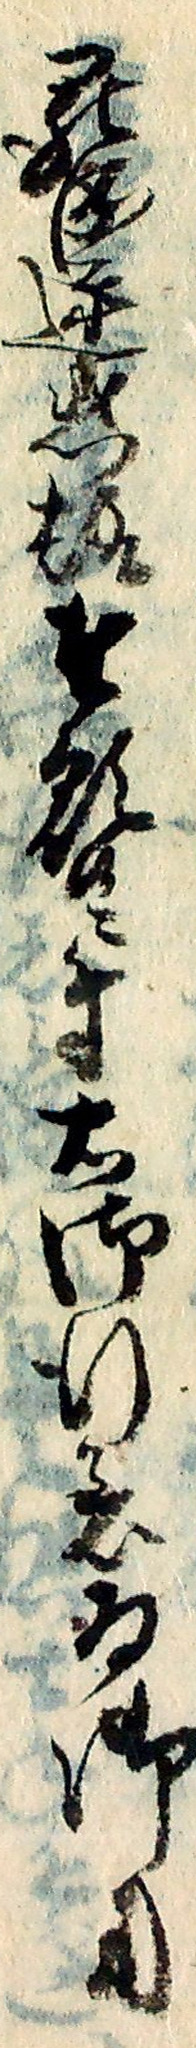罷成迷惑趣を顕候に付右御行着為御用
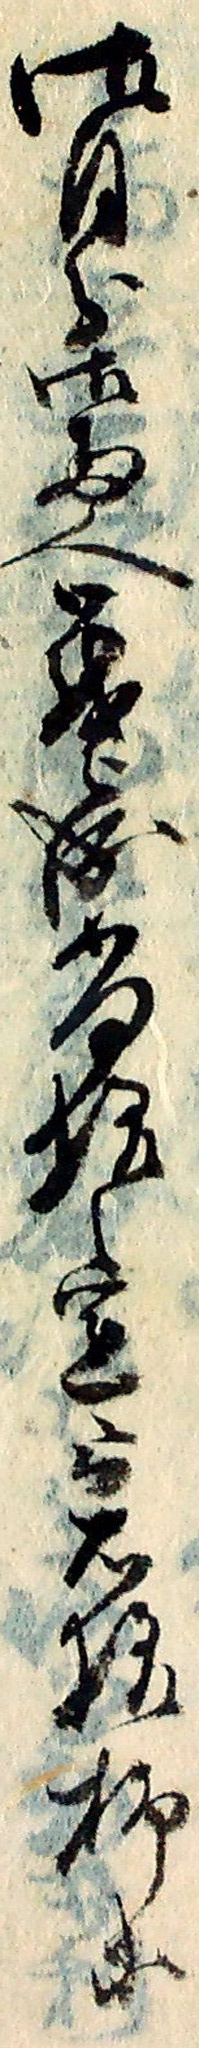御自分御両人御越被成如何様之運にて右様柳木
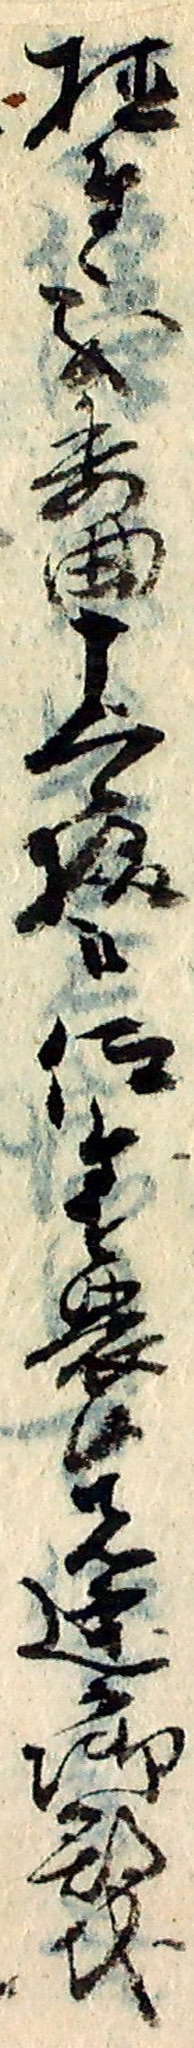植付候義委曲申上候様被仰付奉畏候先達て御郡代
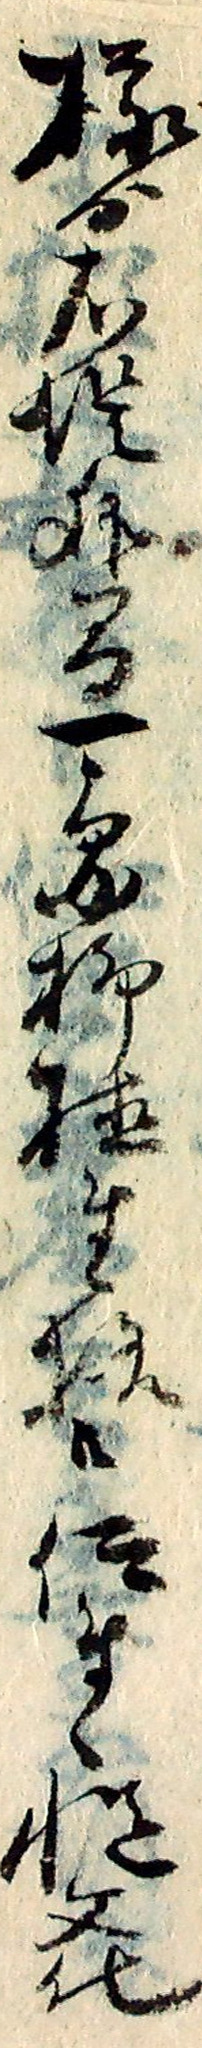様ゟ右堤外間一円柳植付候様被仰付候慥文化
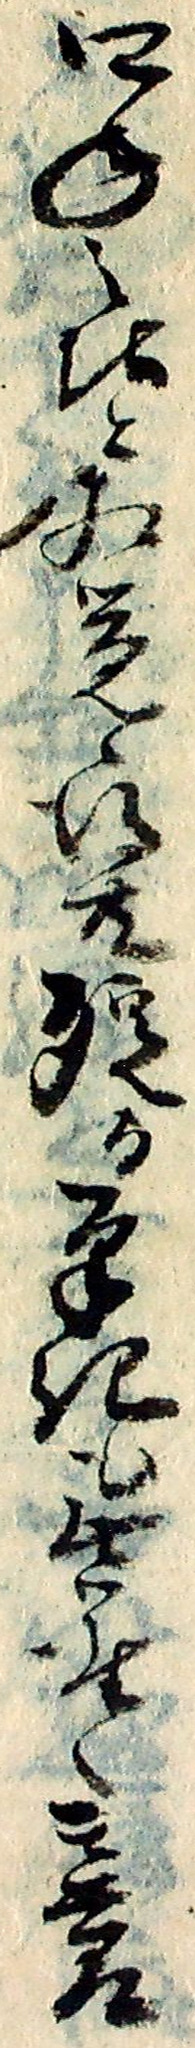四年之比と相覚候得共聢と筆記も無御座候其節
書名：諸御願書控(後藤氏壱番）
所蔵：鳴門教育大学 Naruto University of Education
